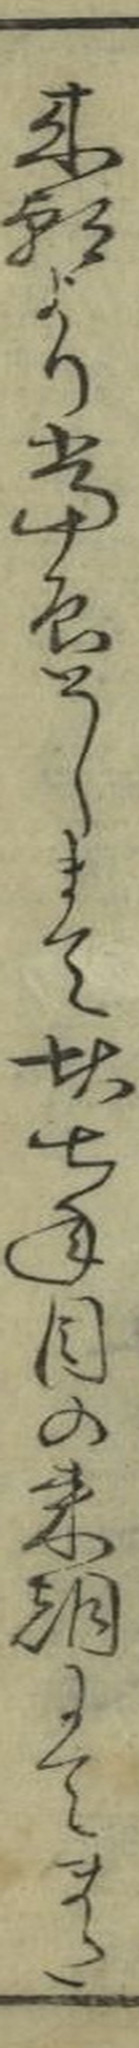来朝より当辰としまて廿七年目の来朝にてまた
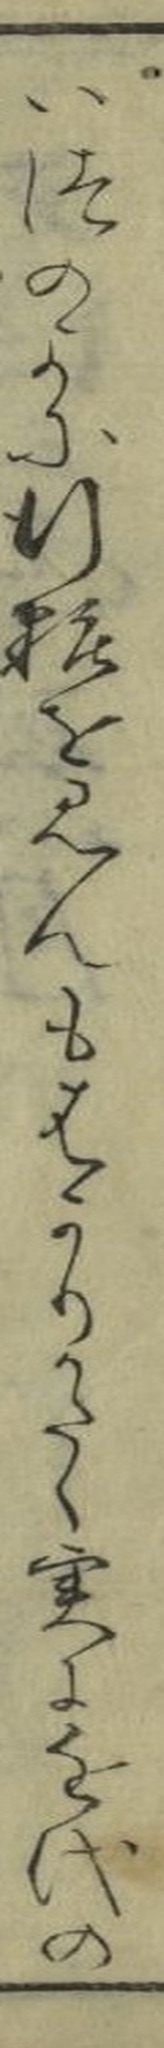いつのよに行粧を見んもはかりかたく実に近代の
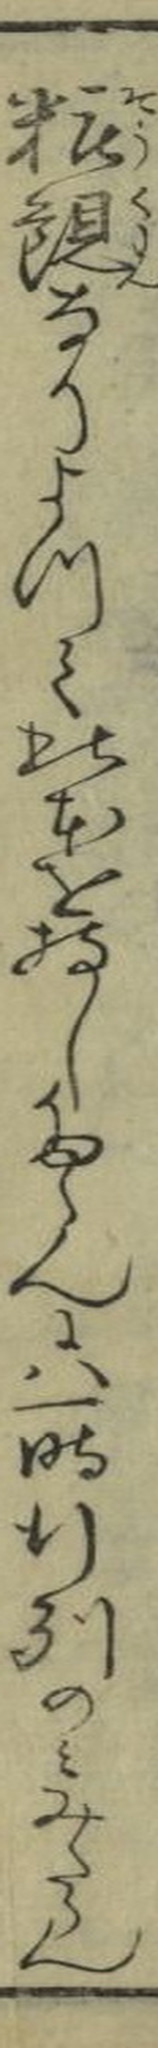粧観なりよつて此本を持したらんには一時行列のみみたらん
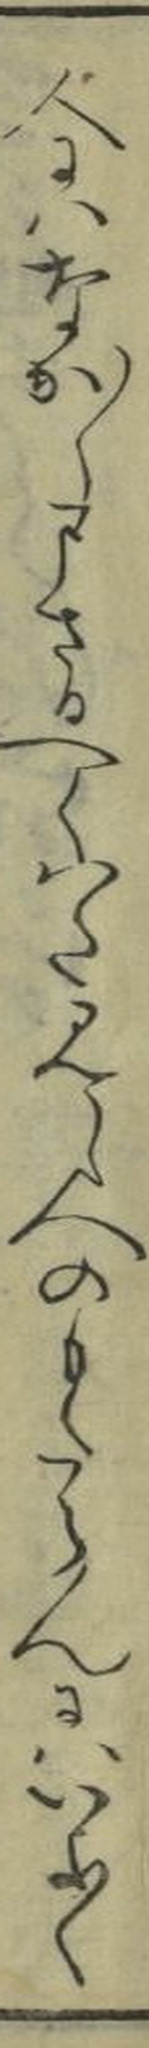人にはなか〳〵まさるへくはた見し人のもたらんにはいよ〳〵
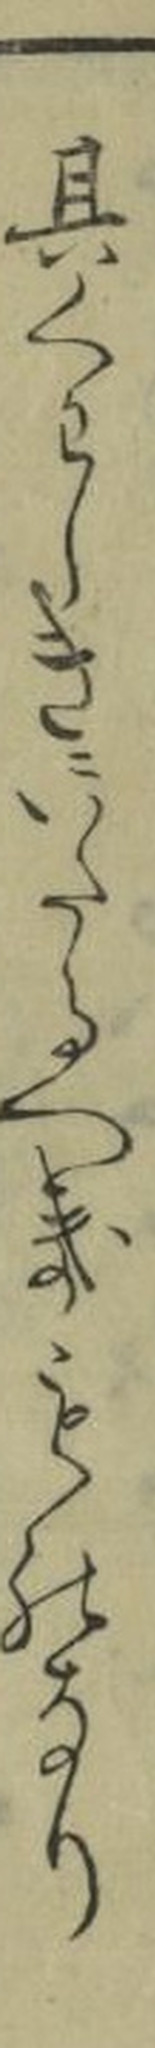其くわしきにいたるへきものなり
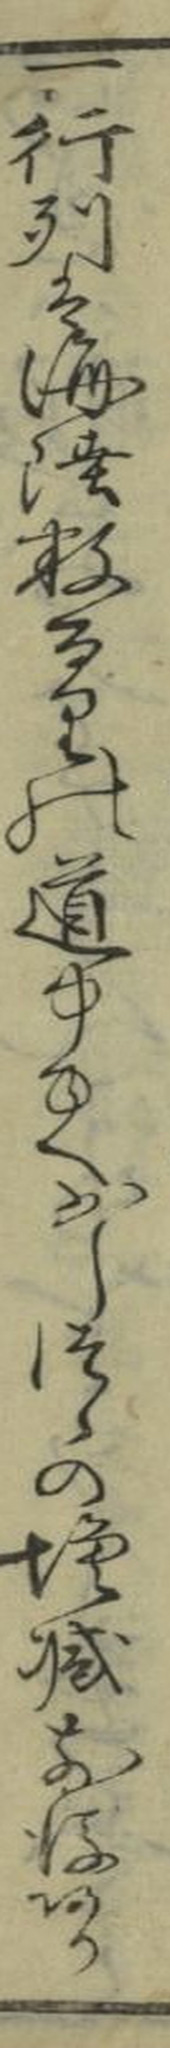一行列は海陸数百里の道中ゆへ少しつゝの増減前後あり
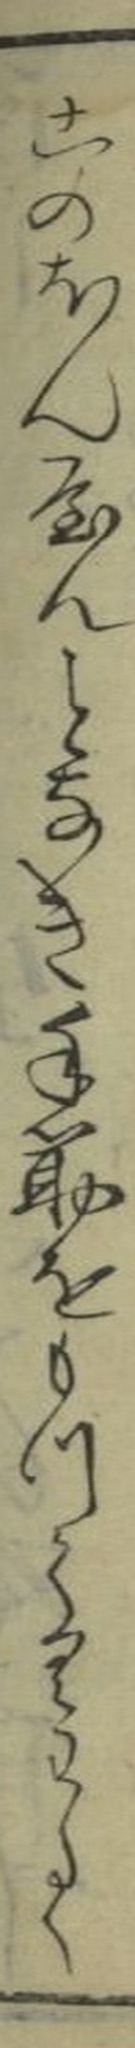このほんやんことなき手筋をもつてくわしく
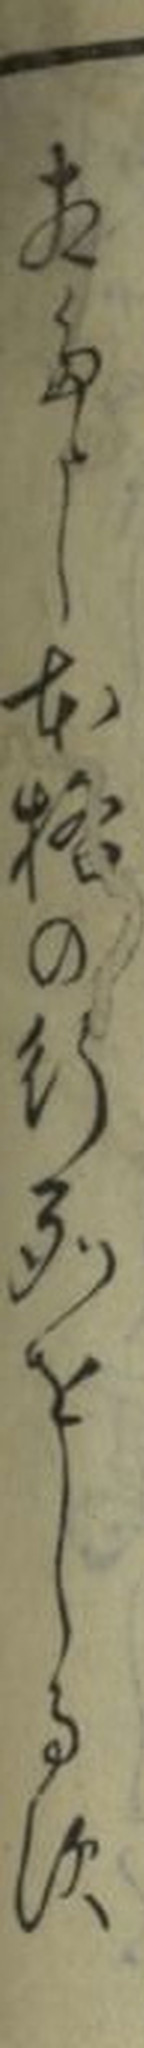相たゝし本格の行列をしるす
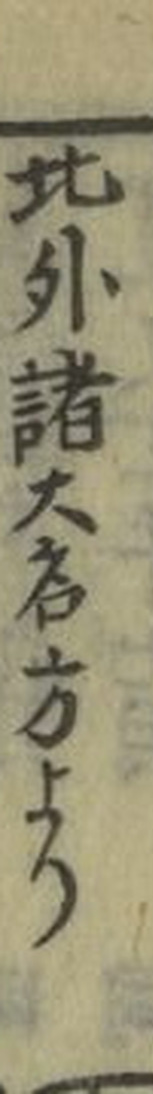此他諸大名方より
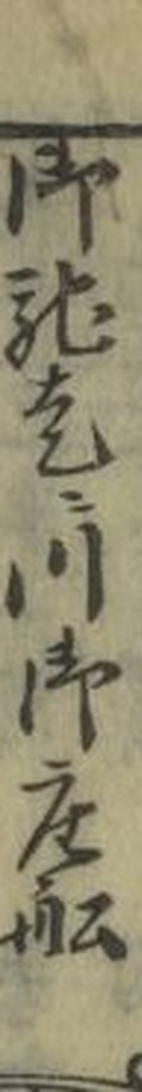御馳走に川御座船
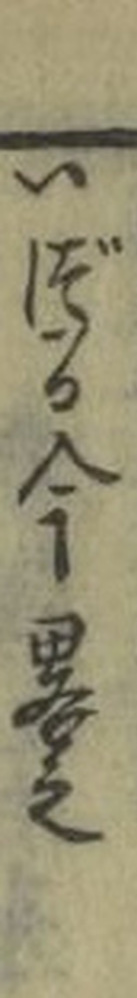いづる今略之

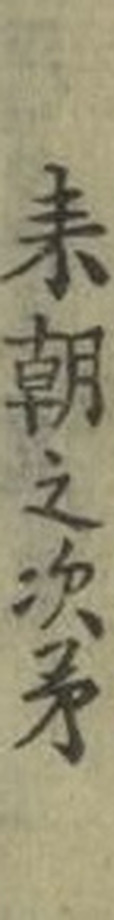来朝之次第
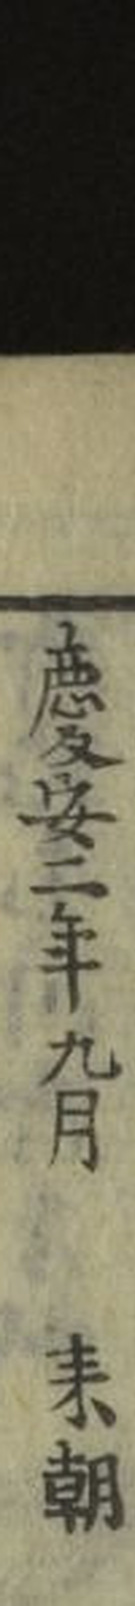慶安二年九月来朝
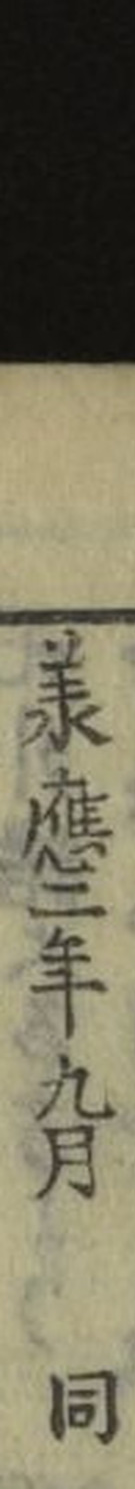承應二年九月同
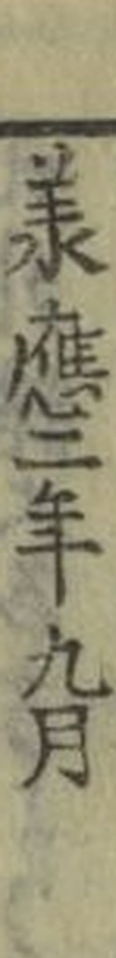承應二年九月同
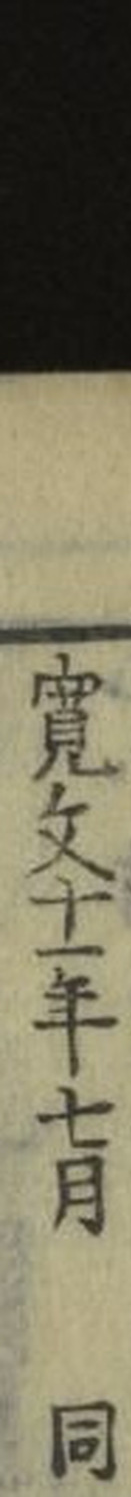寛文十一年七月同
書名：新板 琉球人行列記
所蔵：University of the Ryukyus Library
